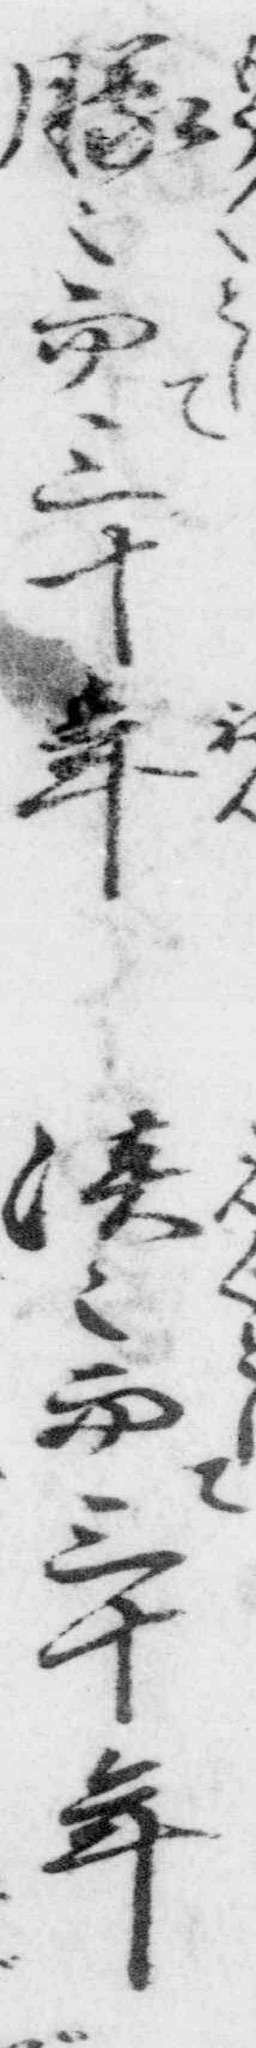朦々而三十年淡々而三十年
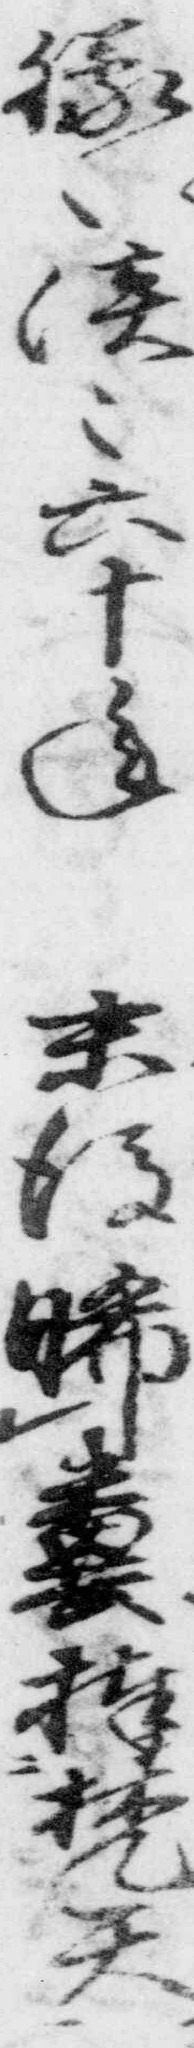朦々淡々六十年末後腣糞捧梵天
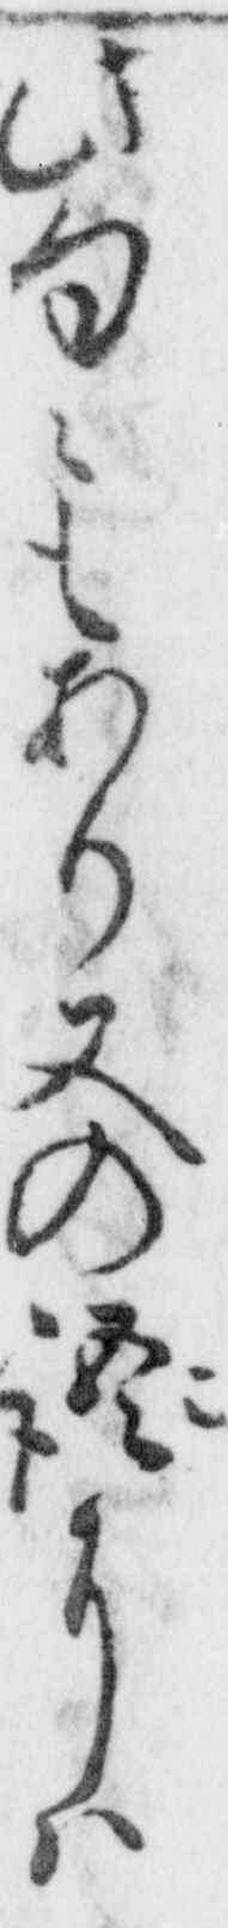此句もあり又の語には
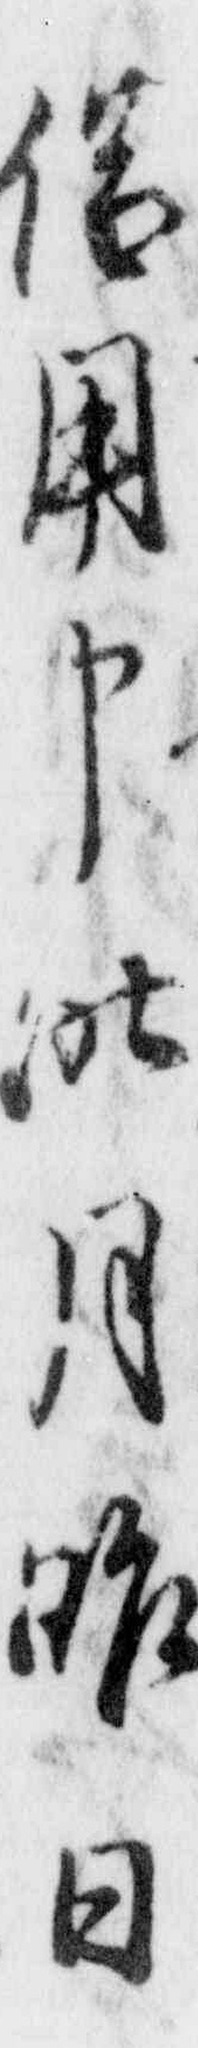借用申昨月昨日
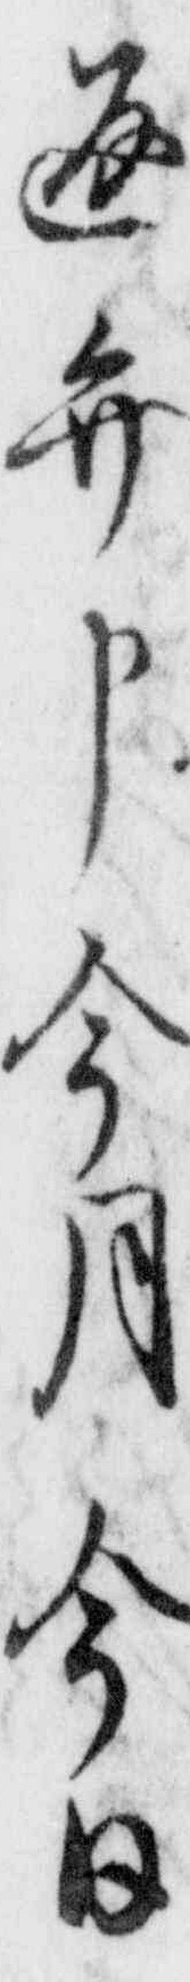返弁申今月今日
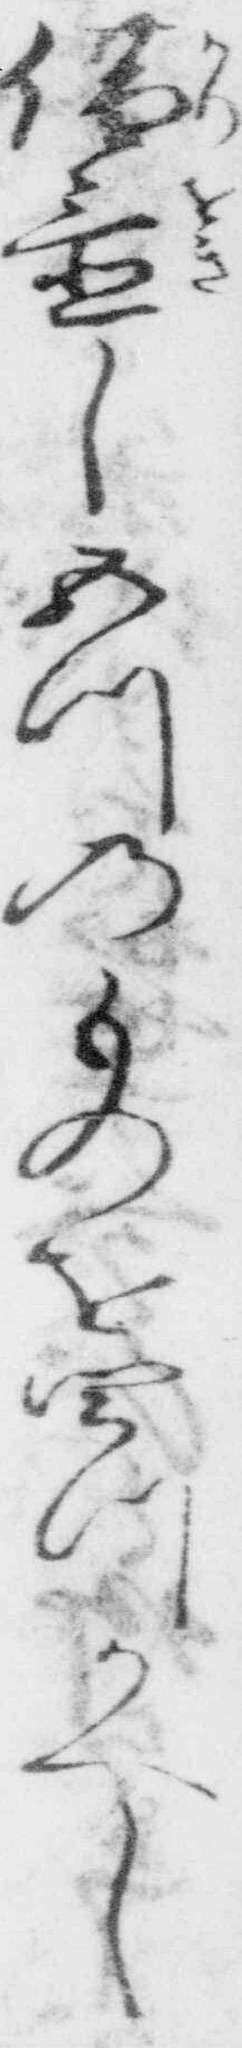借置し五つのものを四つかへし
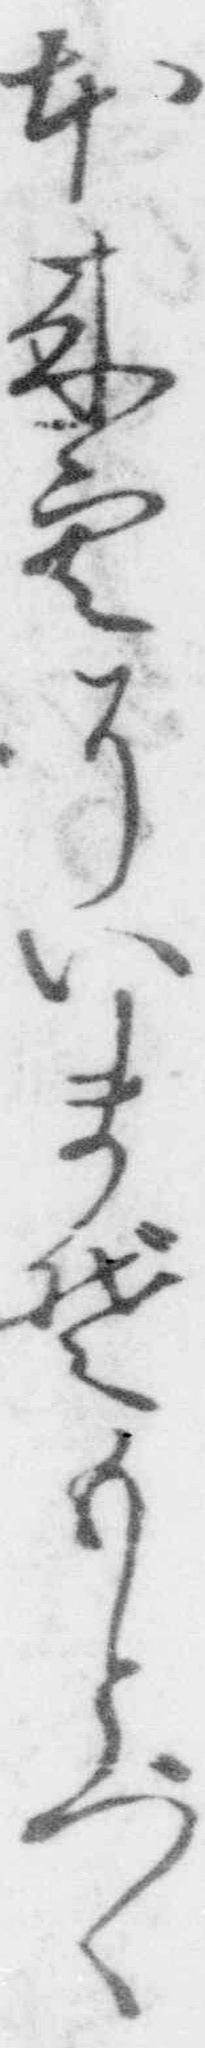本来空にいまぞもとづく
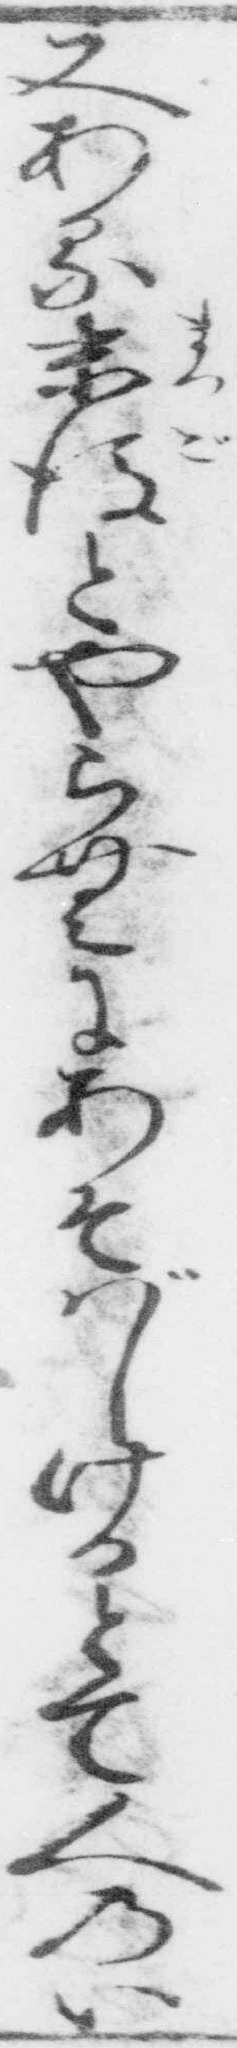又ある末後とやらむにあそばしけるとて人のい
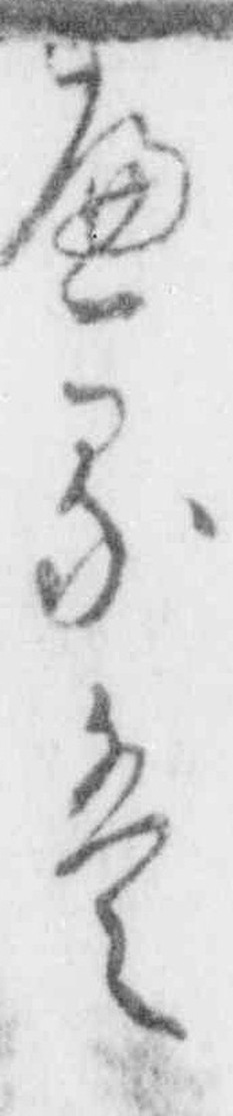へるは
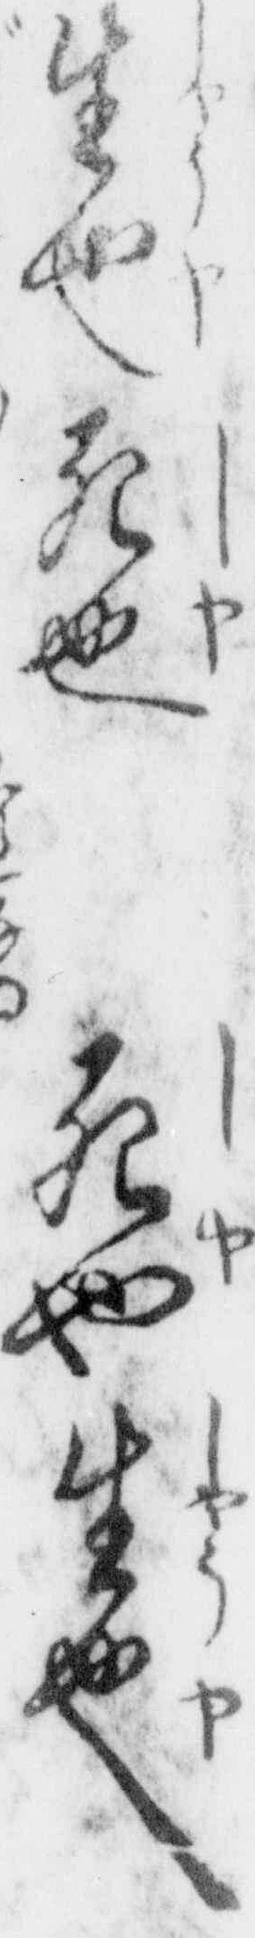生也死也死也生也
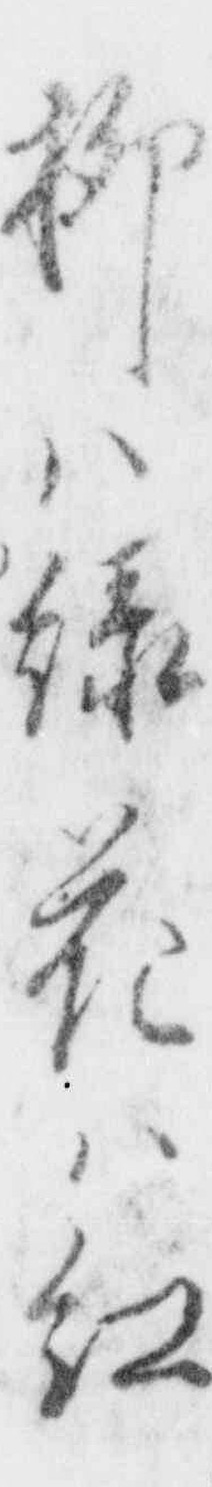柳は緑花は紅
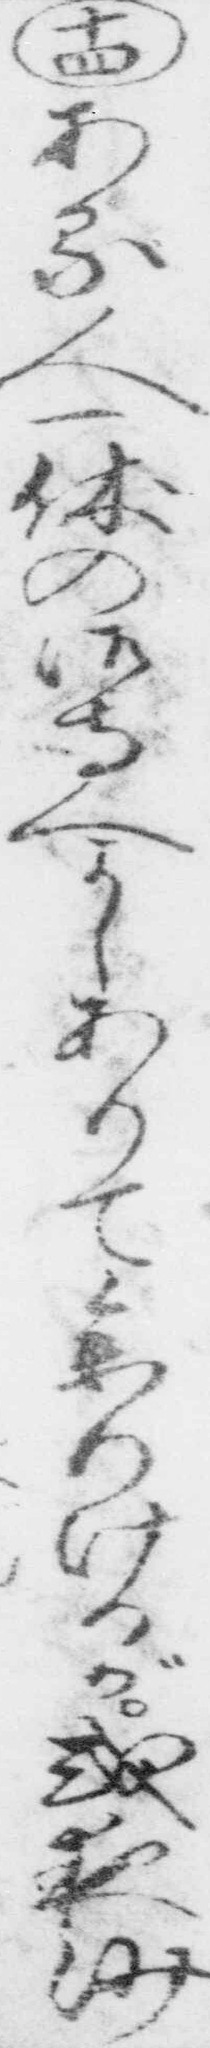『十四』ある人一休の御寺へよしありて参りけるが。或夜沙
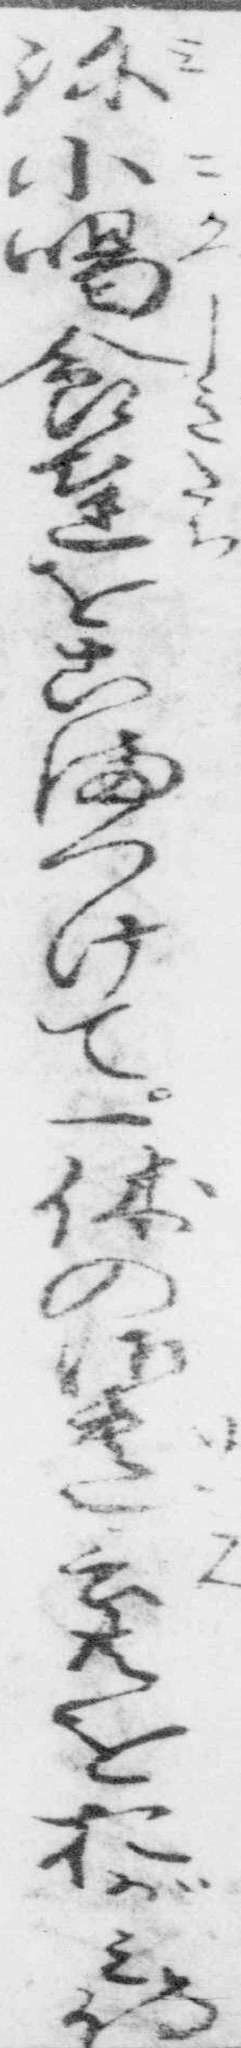弥小喝食達をこまつけて。一休の御遺言共をおがみ侍
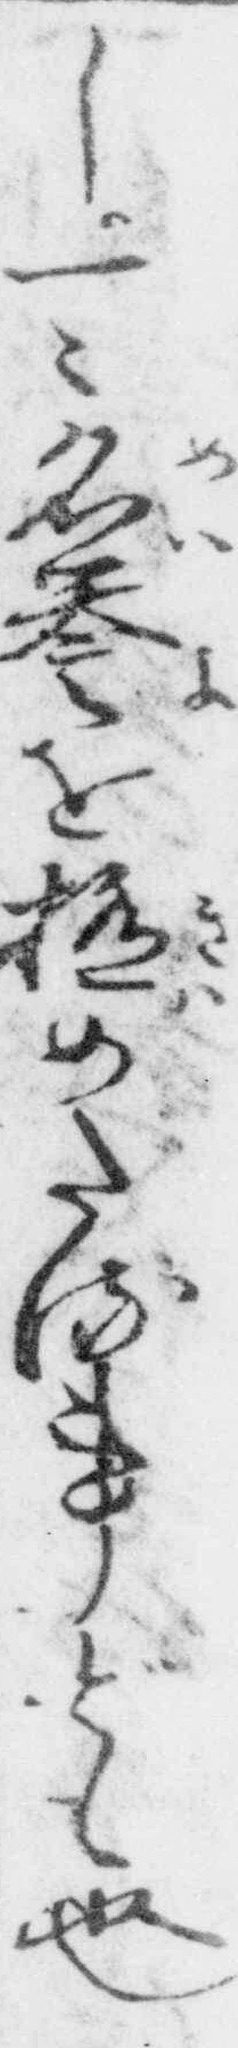し。一々名誉を極めたる事ども也

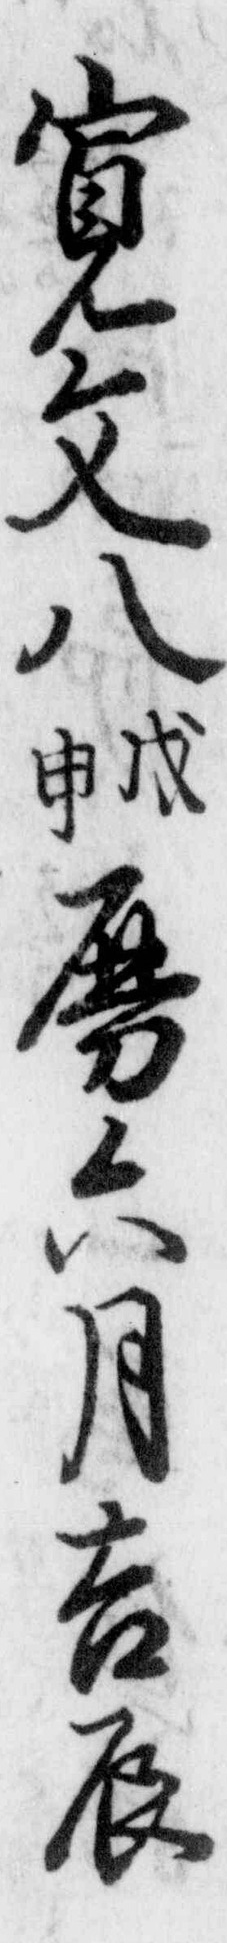寛文八戊申暦六月吉辰
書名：一休はなし（寛文八）
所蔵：名古屋大学附属図書館 国文学研究資料館
